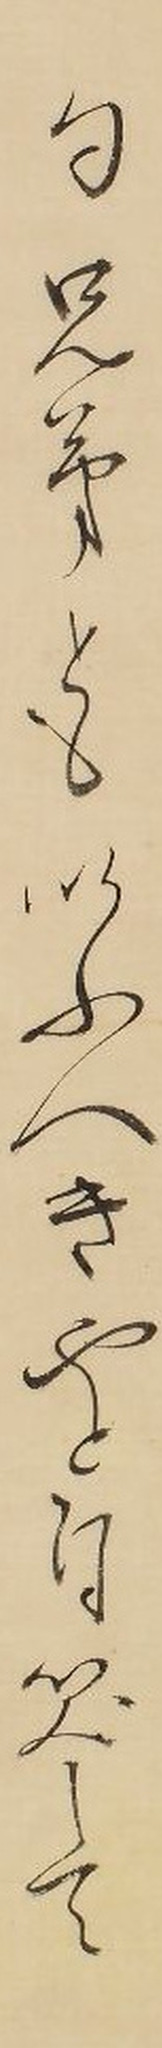句兄弟ともいふへきやと自笑して
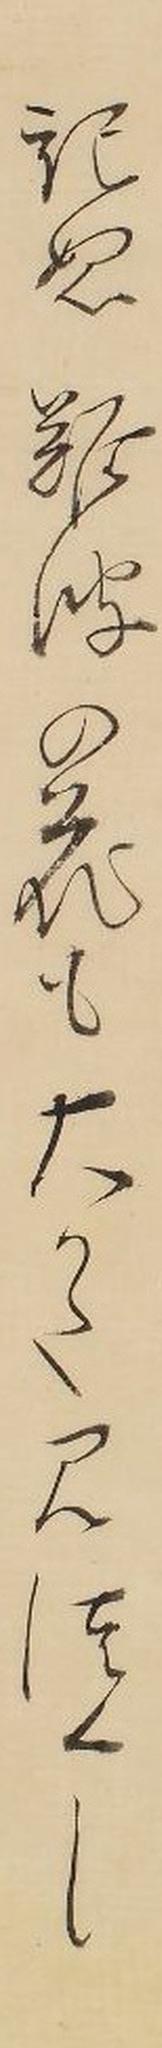記ぬ難波の花も大かた見つくし
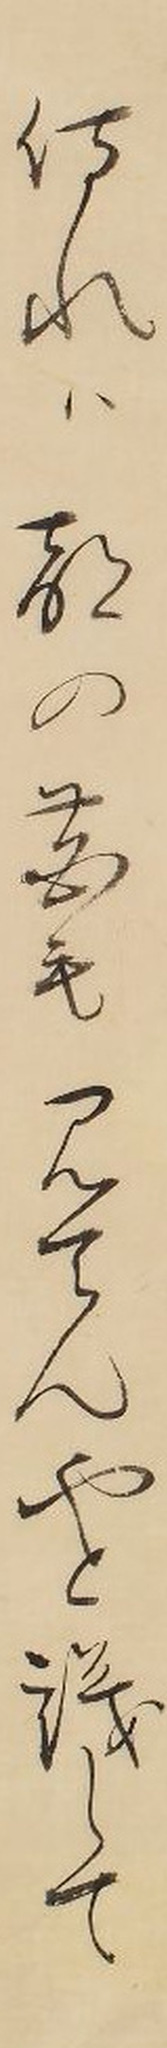侍れは都の花も見てんやと議して
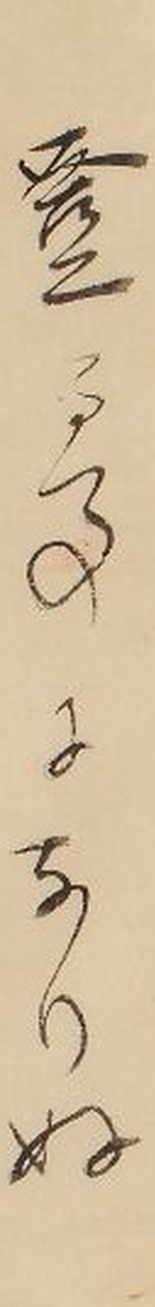登る事になりぬ
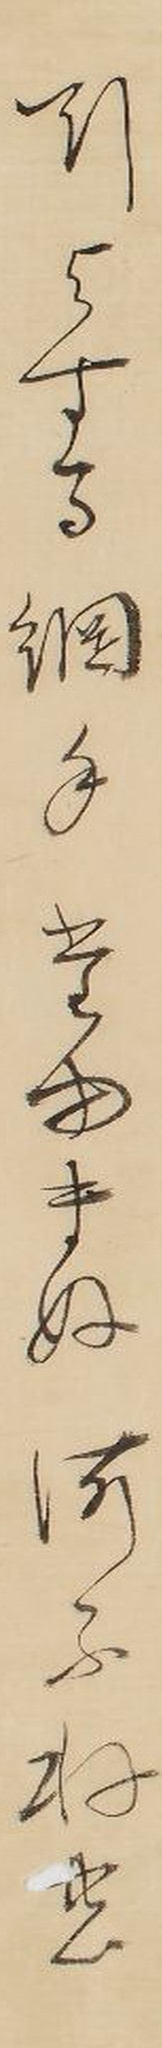引よする綱手たゆまぬ河ふねの
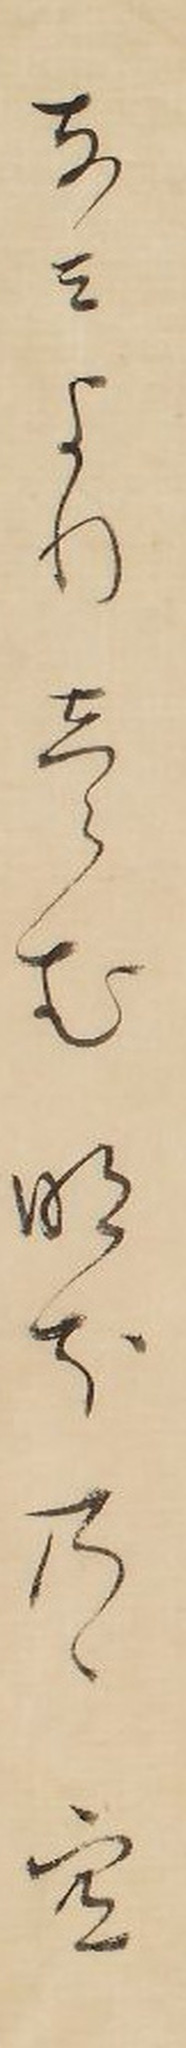なみよりしらむ明ほのゝの空
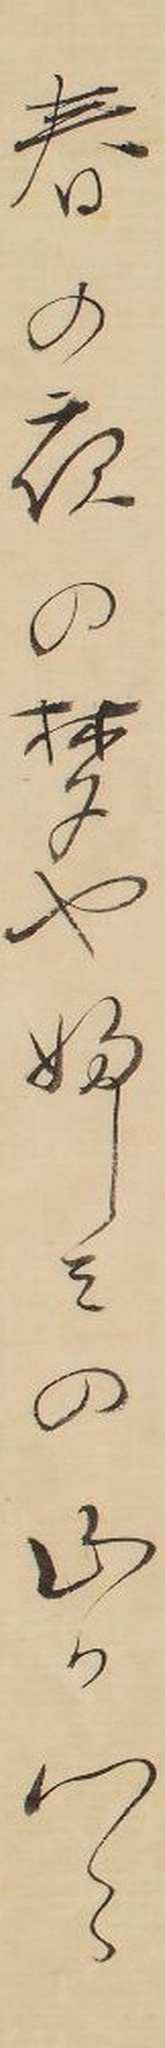春の夜の夢やふしみの山かつら
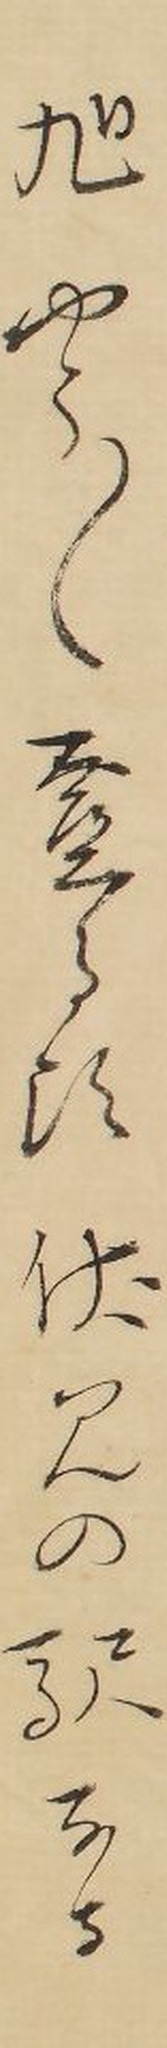旭やう〳〵登る頃伏見の駅なる

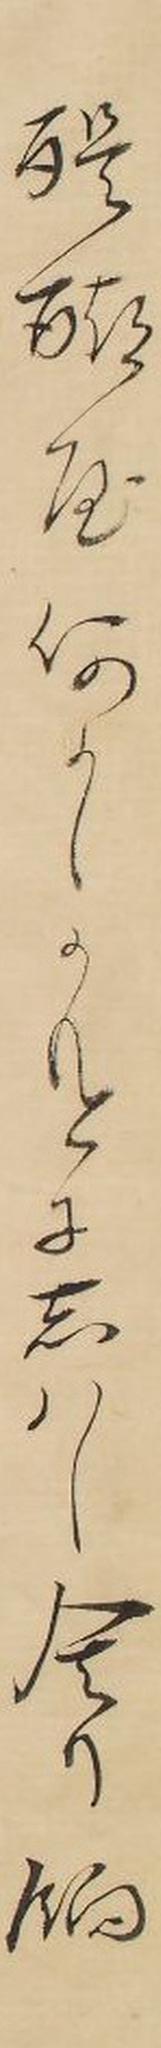醍醐屋何かしかもとにしはし舎り餉
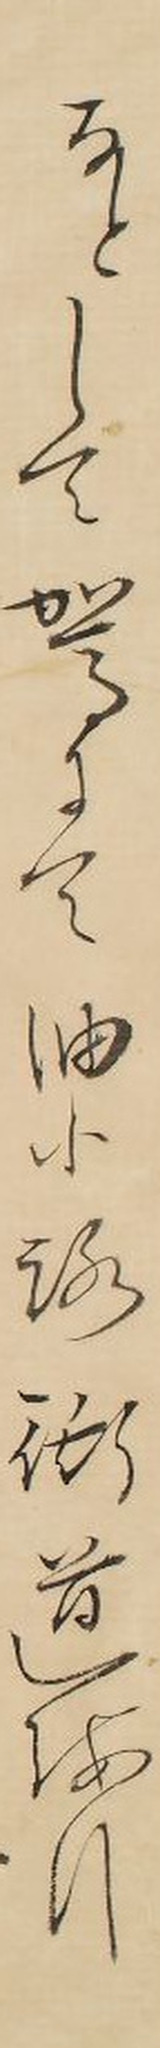なとして駕にて油小路街道を行
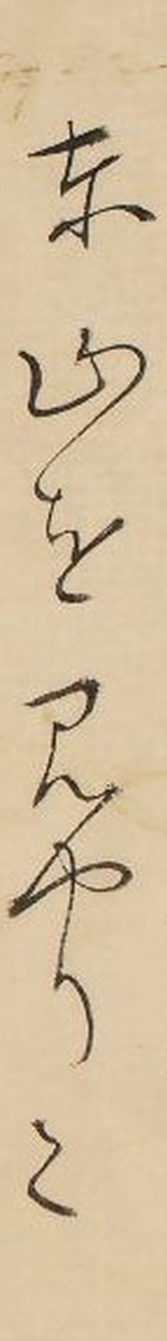東山を見やりて
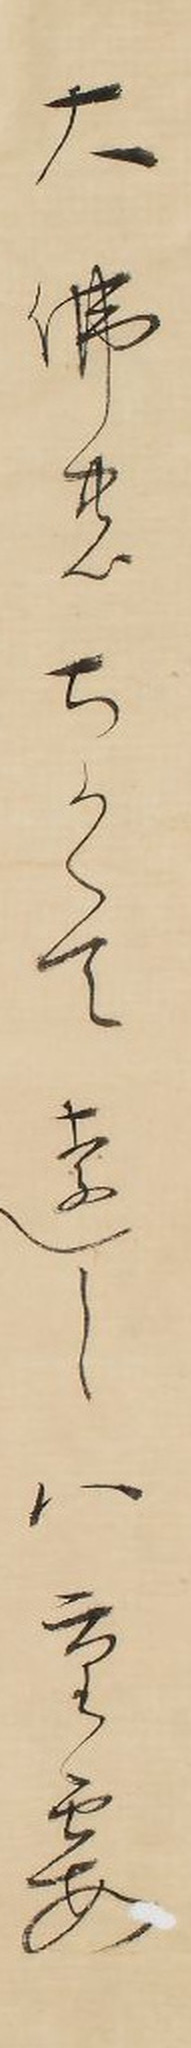大仏のちかくて遠し八重霞
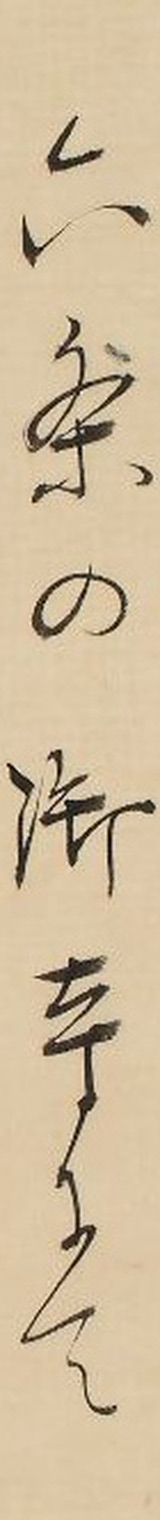六條の御寺にて
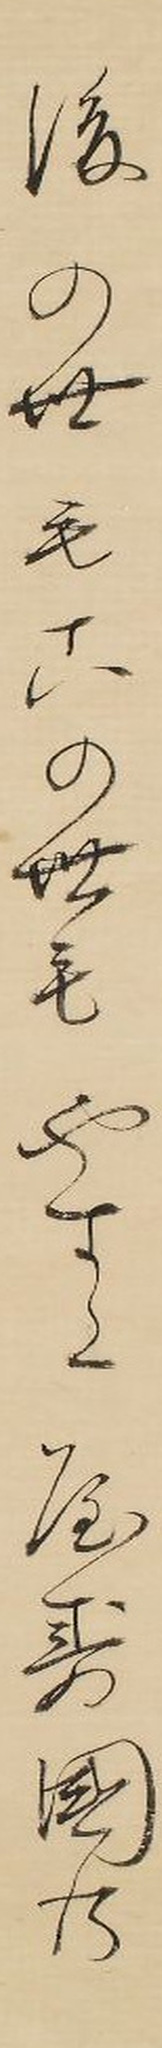後の世もこの世もやすくやす国の
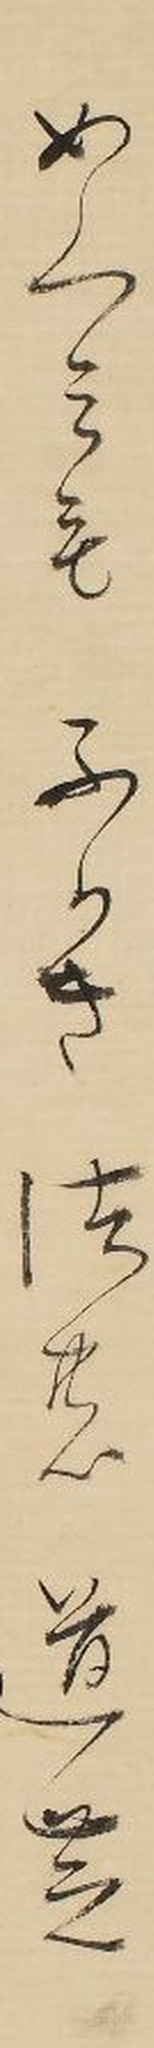めくみもふかき法の道芝
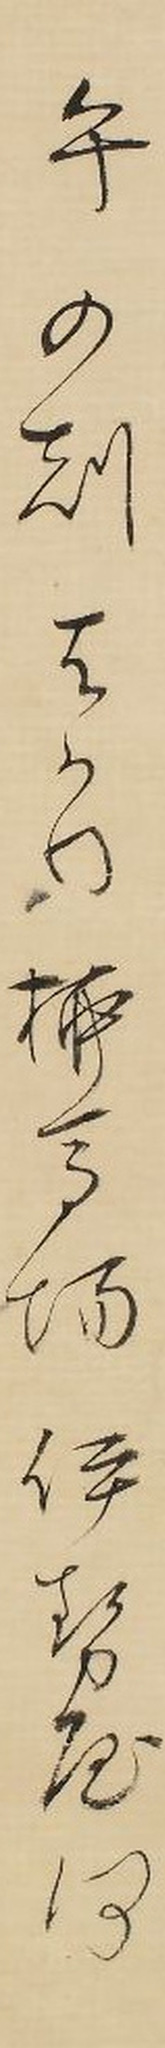午の刻はかり柳馬場伊勢屋何
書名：花土産
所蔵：徳島県立図書館
